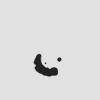㠯（以）
